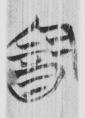酓
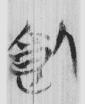飤
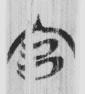宮
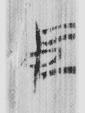𠁩
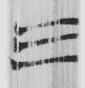三
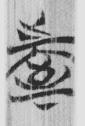{之室}
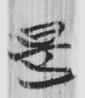是
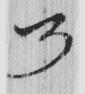乃
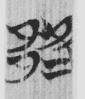{多欠}
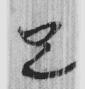巳
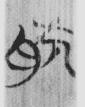肰
